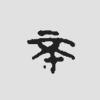不
